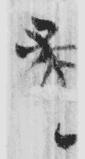求
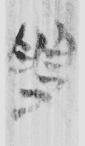受
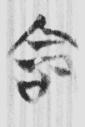命
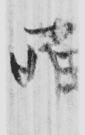唯
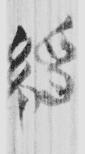{糸爪勺}
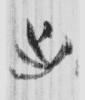出
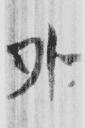外
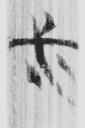必
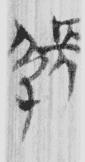張
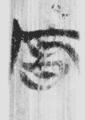晨
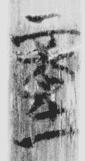童
